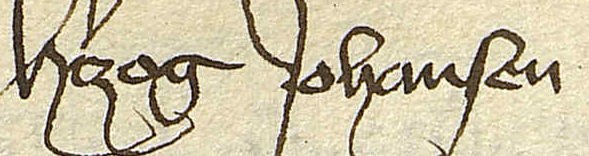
H*cʒog Iohanſen
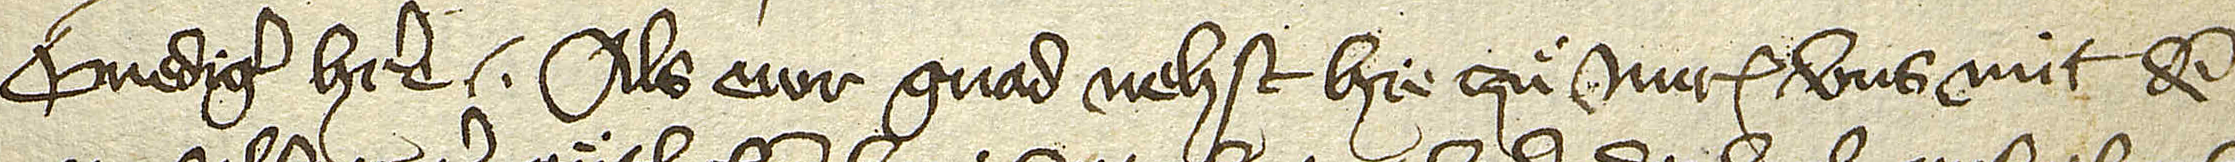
Gnedig* hr*e / . Als ewr gnad nehſt hie cʒü Nur* / vns mit d*
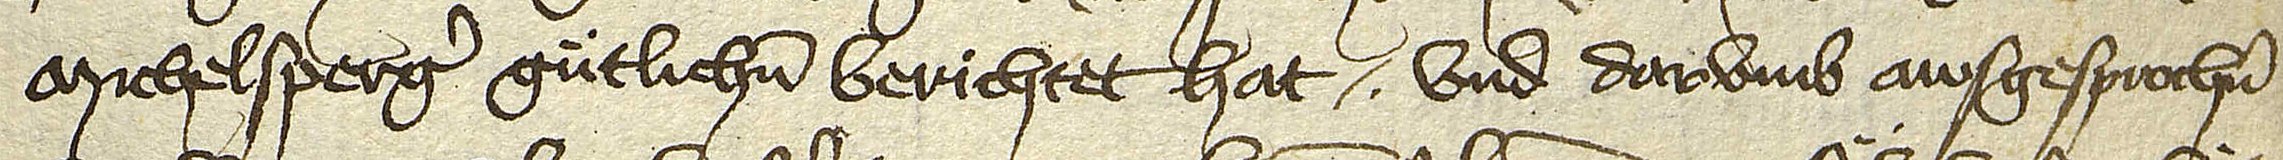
Michelſperg* gütlichn* berichtet hat / . vnd darvmb awſgeſprochn*
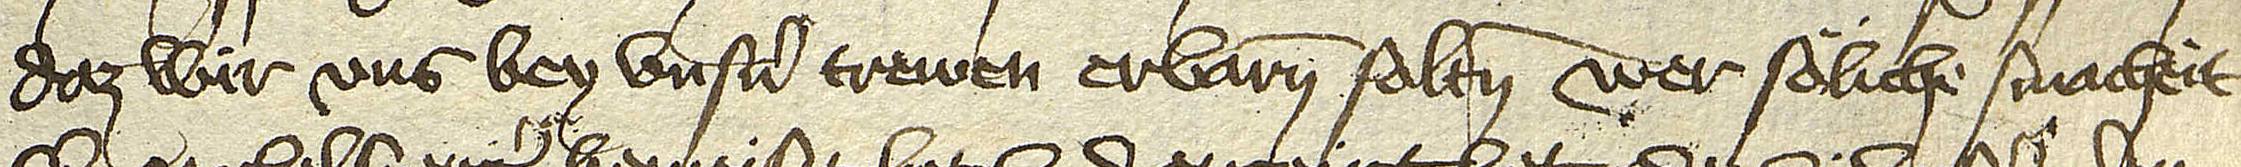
daʒ wir vns bey vnſn* trewen ervarn* ſoltn* wer ſöliche ſmacheit
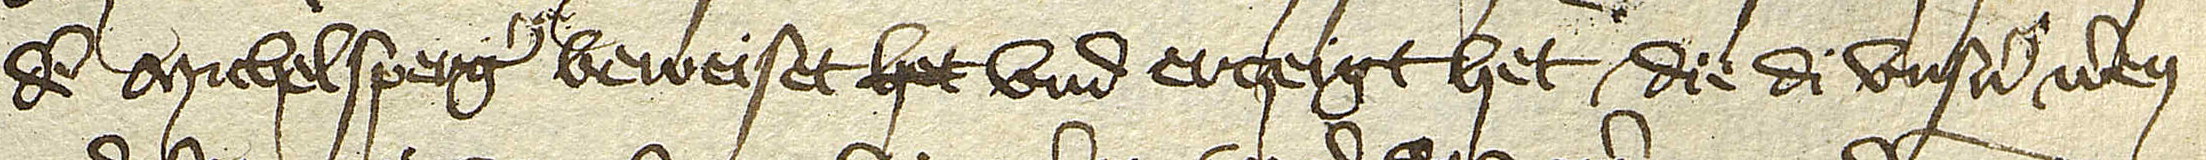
d* Michelſperg* beweiſet het vnd ercʒeigt het / die di vnſn* w*en
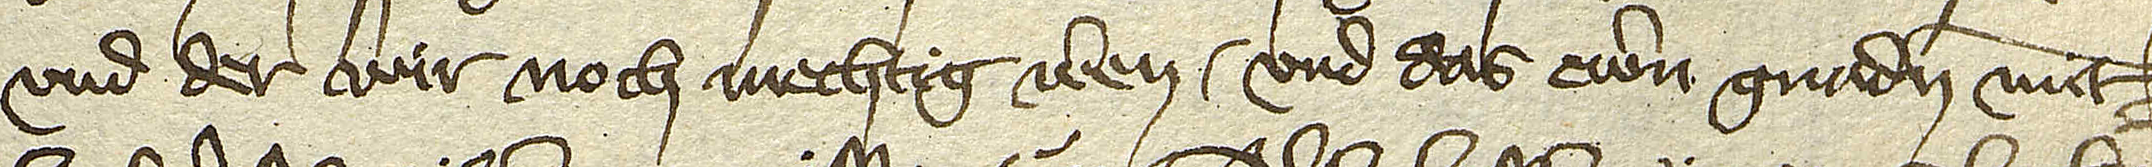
vnd der wir noch mechtig w*en / vnd das ew*n gnadn* mit
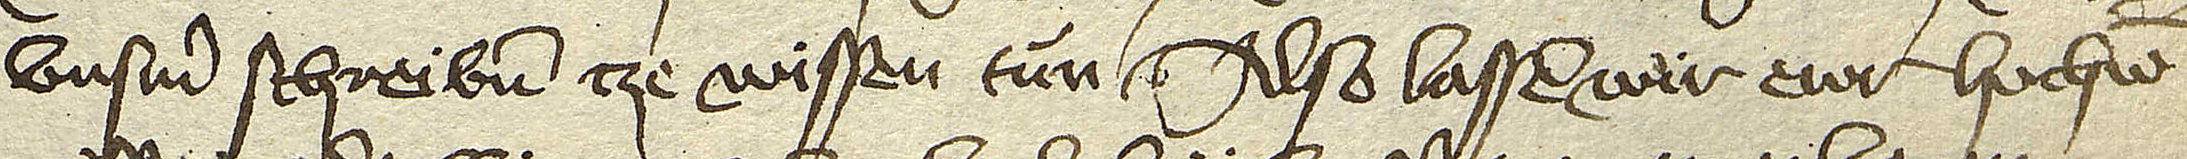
vnſm* ſchreibn* cʒe wiſſen tün / Alſo laſſe* wir ewr hochw*
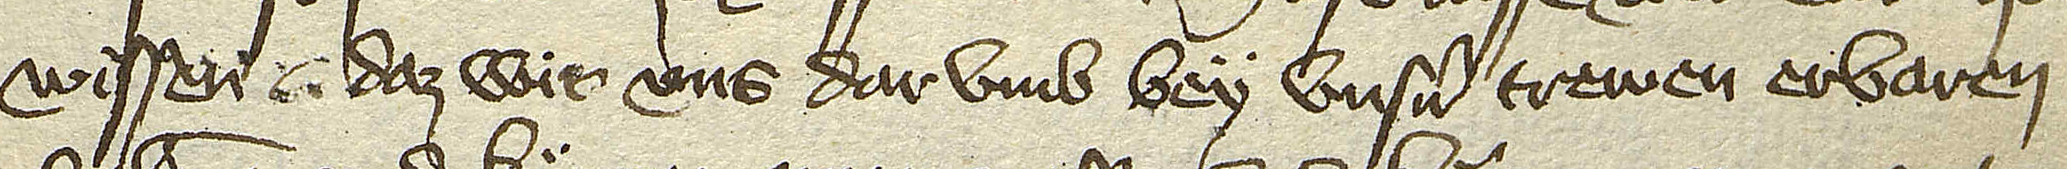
wiſſen / daʒ wir vns darvmb bey vnſn* trewen ervaren
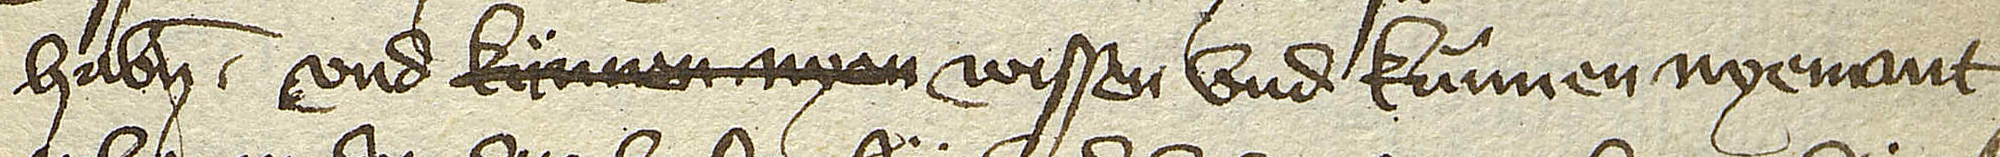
habn* / vnd künnen nyen wiſſen vnd künnen nyemant
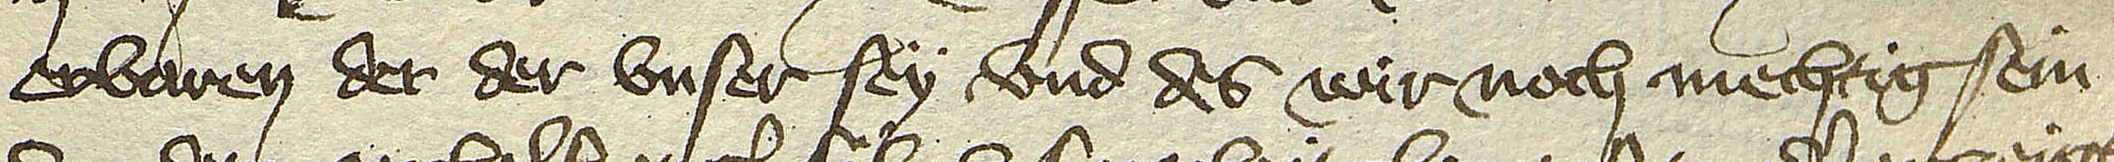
ervaren der der vnſer ſey / vnd des wir noch mechtig ſein
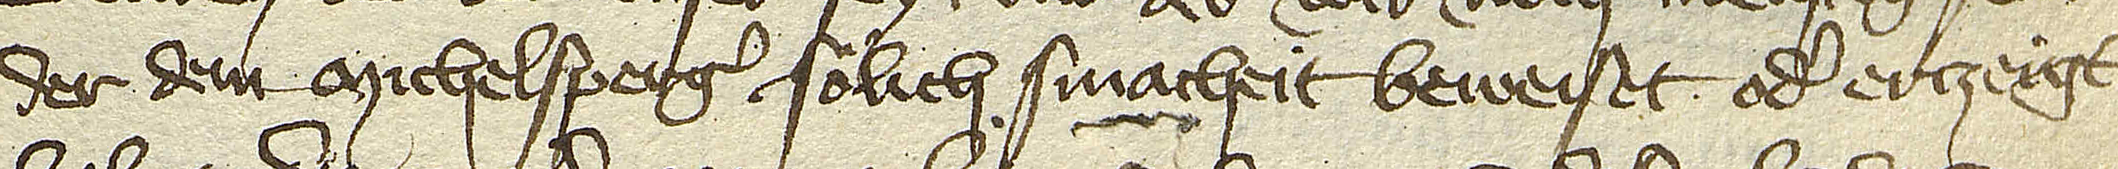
der dem Michelſperg* / ſölich ſmacheit beweiſet od* ercʒeigt
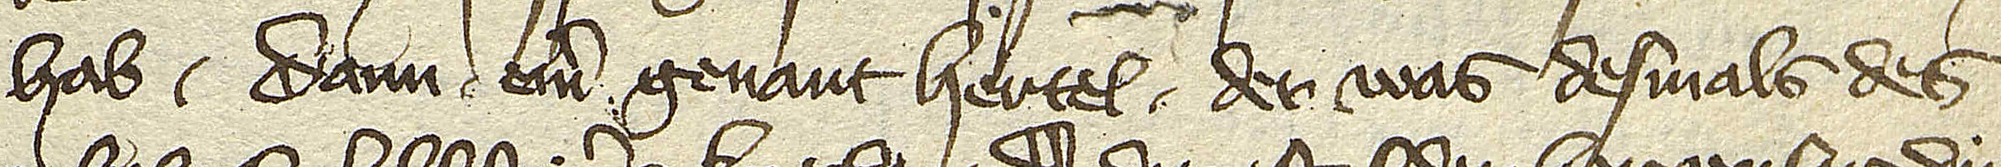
hab / Dann / ein* genant hertel / der was deſmals des
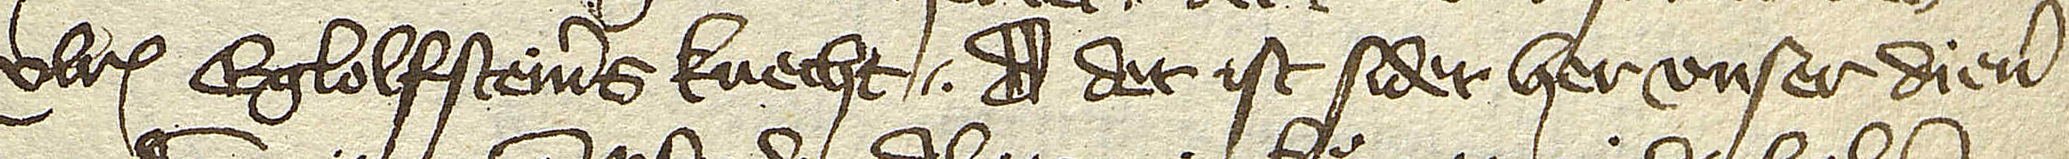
vlr* Eglofſtein*s knecht / . D der iſt ſider her vnſer dien*
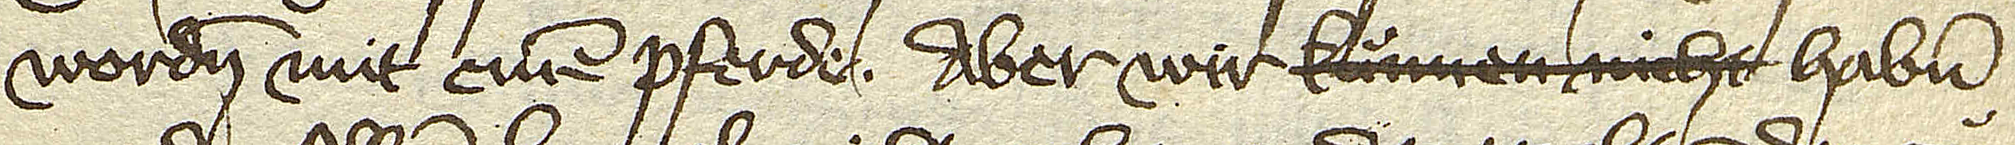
wordn* mit eine* pferde / . Aber wir künnen nicht habn*
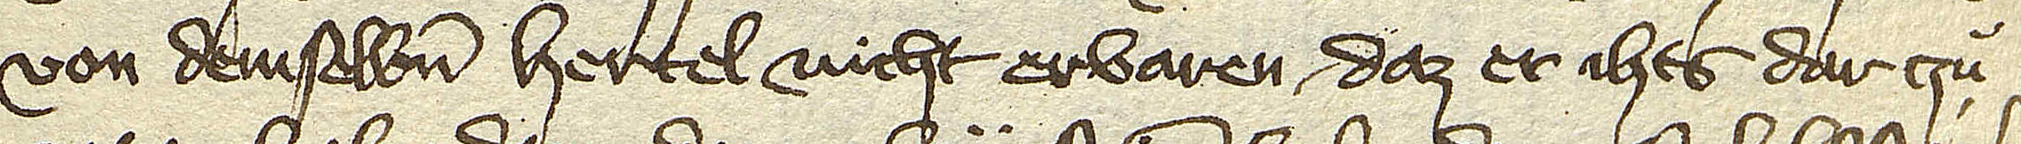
von demſelbn* hertel nicht ervaren / daʒ er ihts dar cʒü
